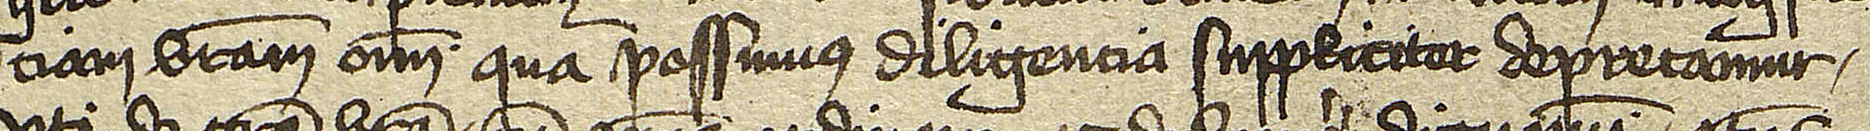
ciam v*ram om*i qua poſſum* diligencia ſuppliciter deprecamur /
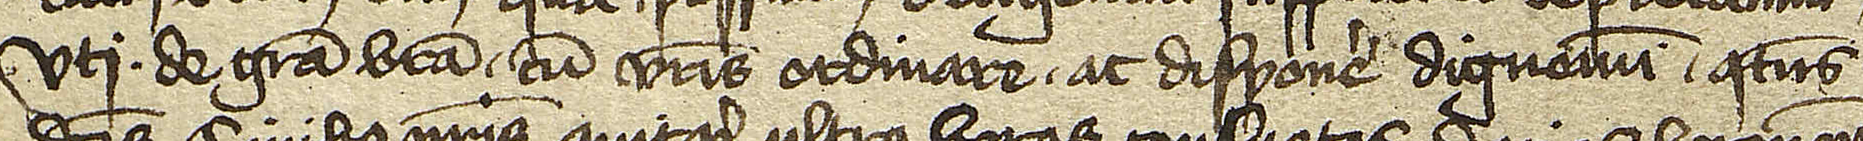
vti . de gr*a v*ra cu* v*ris ordinare / ac diſpone* dignem* / q*t*us
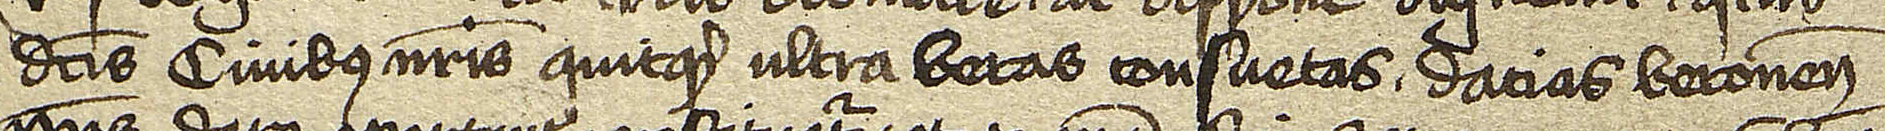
d*is Ciuib* n*ris quicq* ultra veras conſuetas / dacias Veronen*
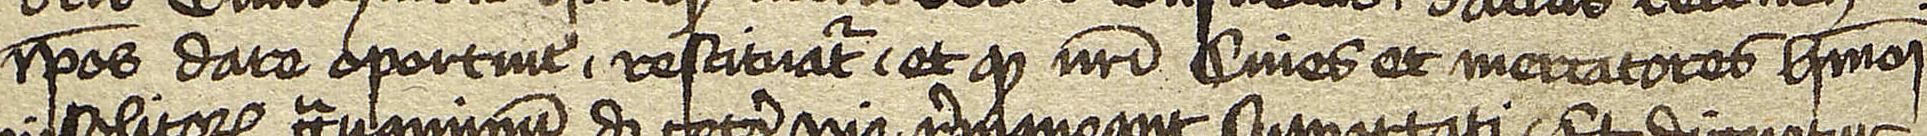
ip*os dare oportuit / reſtituat* / et q* n*ri Ciues et mercatores h*mo*i
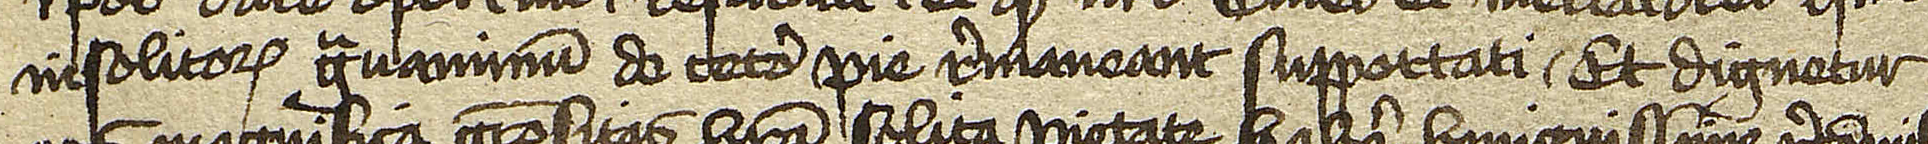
inſolito* g*vaminu* de cet*o pie r*maneant ſupportati / Et dignetur
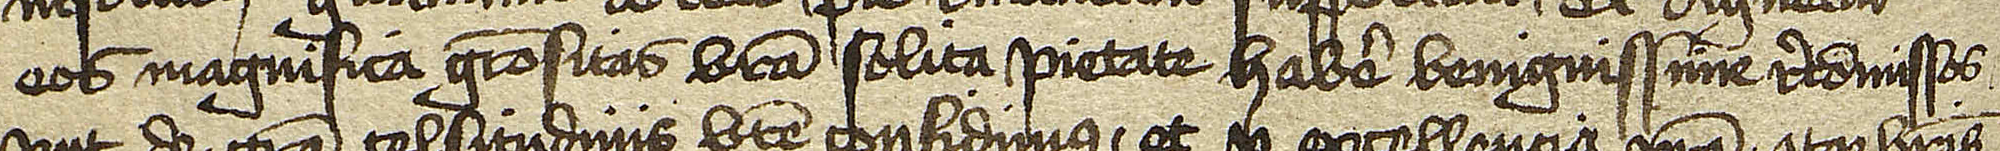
eos magnifica gr*oſitas v*ra ſolita pietate habe* benigniſiſme r*co*miſſos
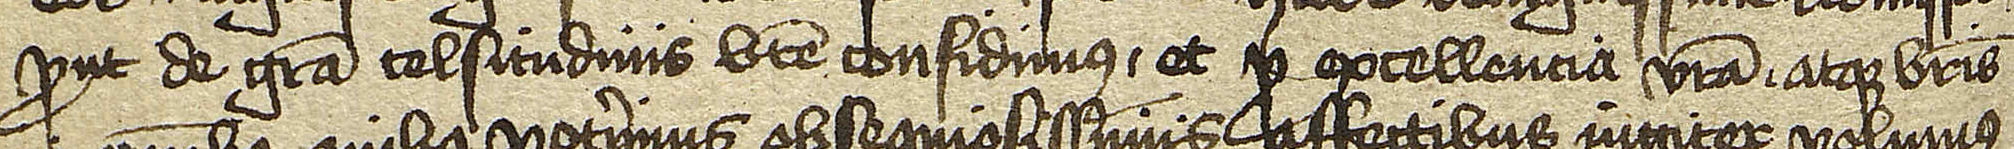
p*ut de gr*a celſitudinis v*re confidim* / et p* excellencia v*ra / atq* v*ris
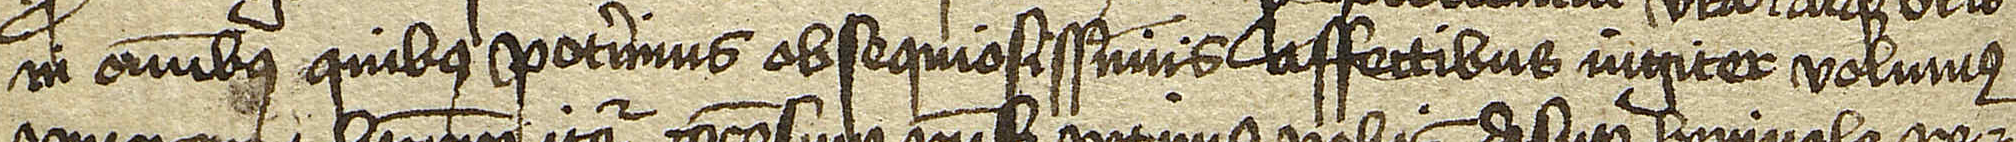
in omnib* quib* potu*imus obſequioſiſſim* affectibus iugiter volum*
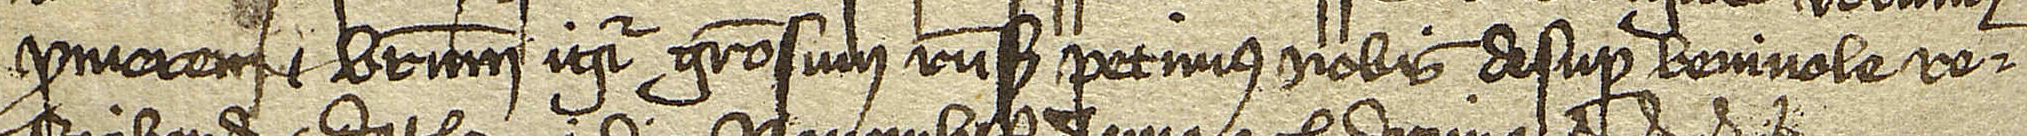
p*mereri. V*rum igi* g*r*oſum r*nſ* petim* nobis deſup* beniuole re =
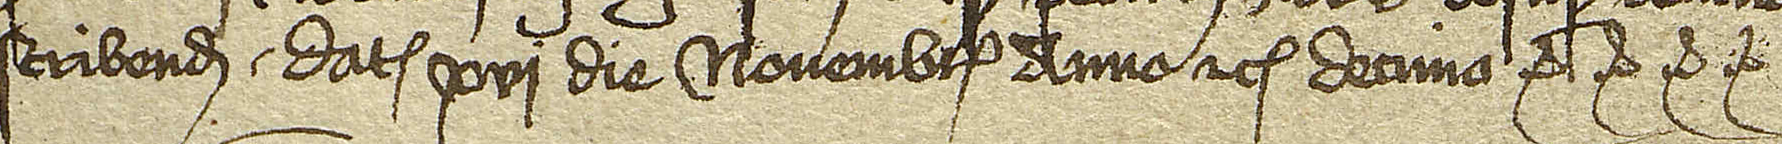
ſcribend* / Dat* xvi die Nouembr* Anno ec* decimo § § § §
